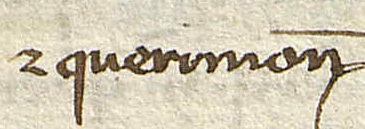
@ querimon*
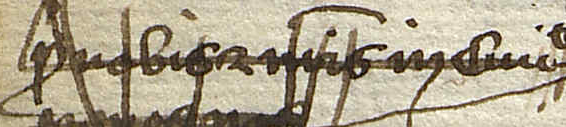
p*uobis @ nris* in Ciui*
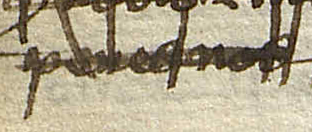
penes nos
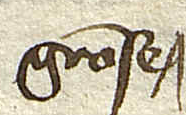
groſe*
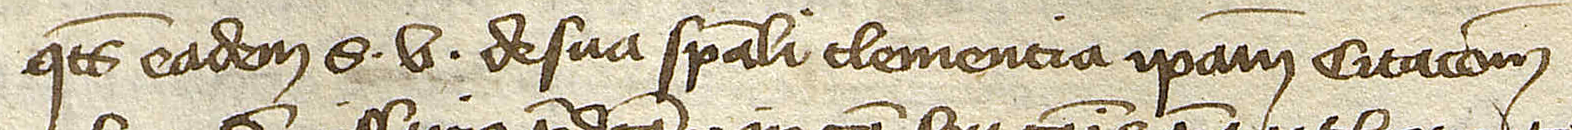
q*t*s eadem S . v . deſua ſp*ali clemencia ip*am Citac*o*m
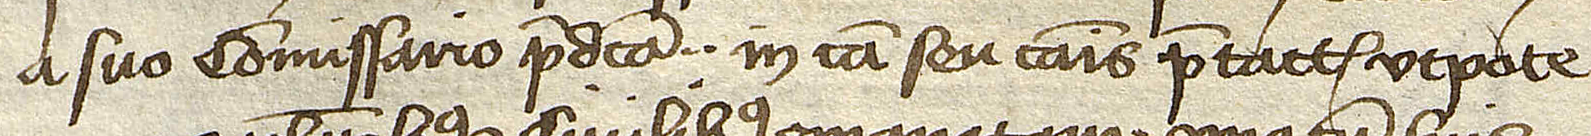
a ſuo Comiſſario p*d*c*o . . in c*a ſeu ca*is p*tact* vtpote
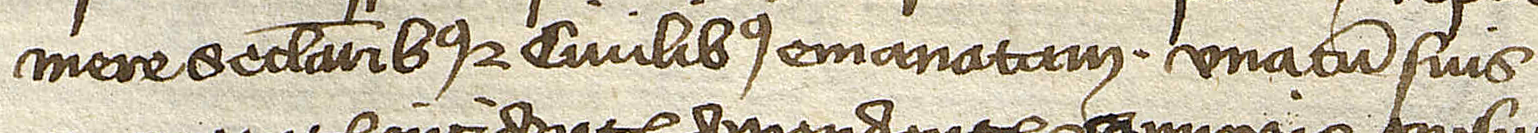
mere Sec*larib* @ Ciuilib* emanatam . vnacu* ſuis
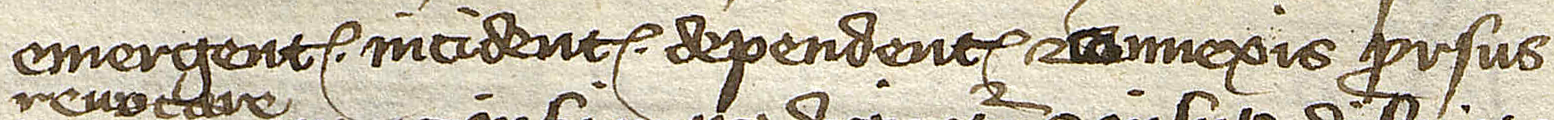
emergent* . incident* . dependet* @ annexis p*rſus
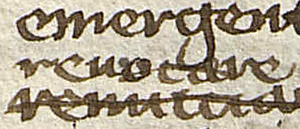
reuocare
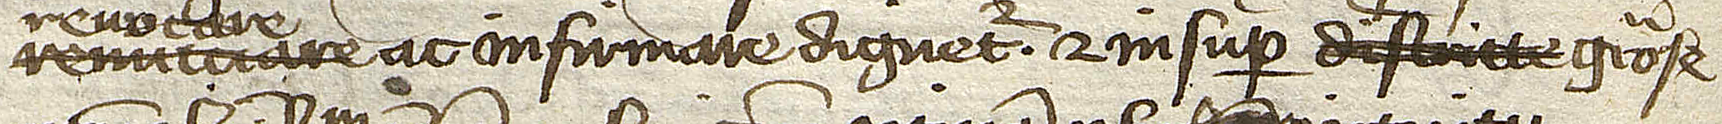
remittare ac infirmare digenet* . @ inſup* diſcritte groſe*
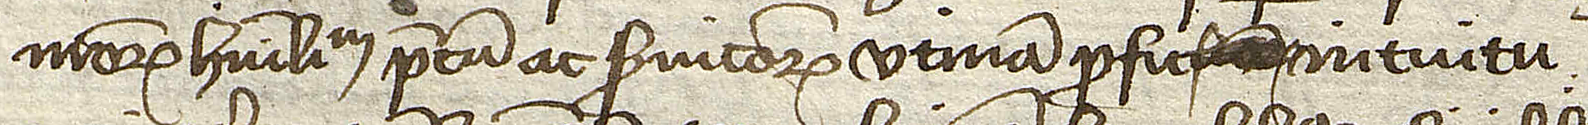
n*ror* hu*ili* p*cu* ac ſ*uico* vtima* p*fic%%* intuitu
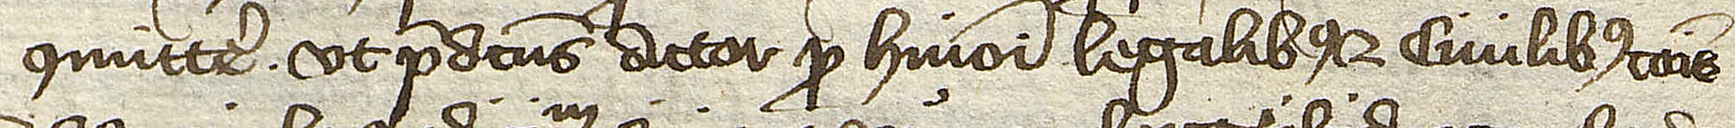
*mitter* . vt p*d*c*us Actor p* hui*o*i legalib* @ Ciuilib* ca*is
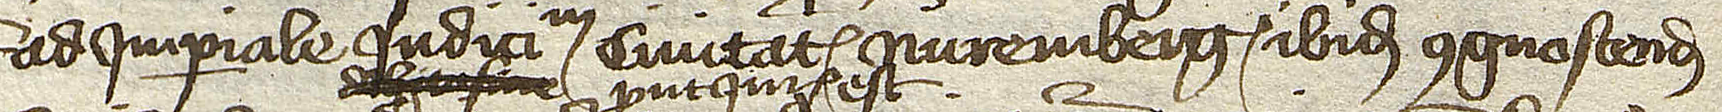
ad Imp*iale Iudici* Ciuitat* Nüremberg* ibid* *gnoſcend*
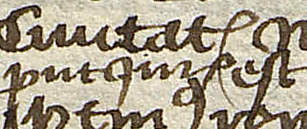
p*ut Iur* eſt
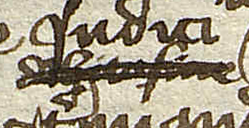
%%%%%%
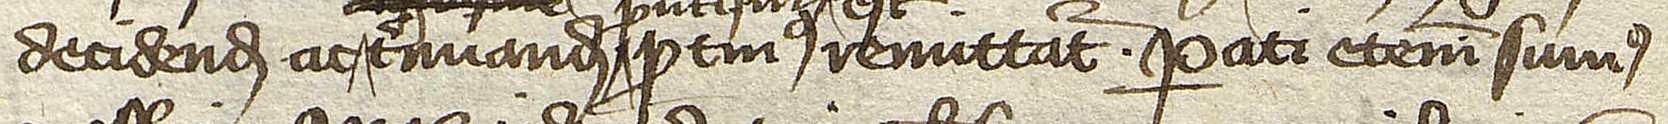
decidend* ac t*mi*and* p*tin* remittat* . P*ati ete*ni ſum*
